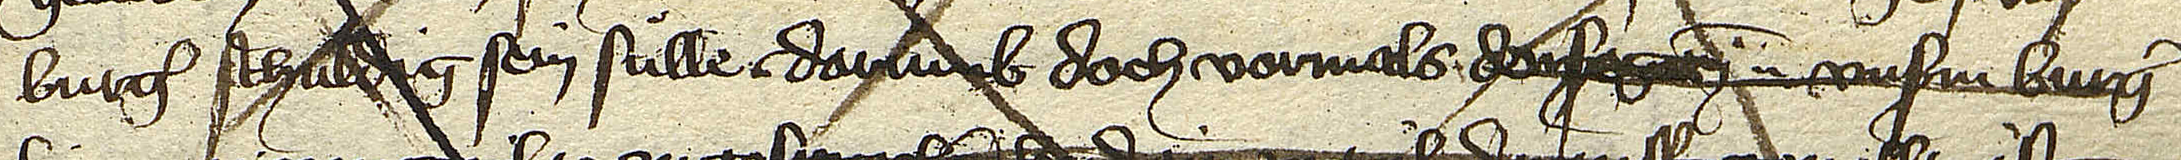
burg* ſchuldig ſein ſülle / darumb doch vormals demſ*egen* ~ vnſ*m burg*
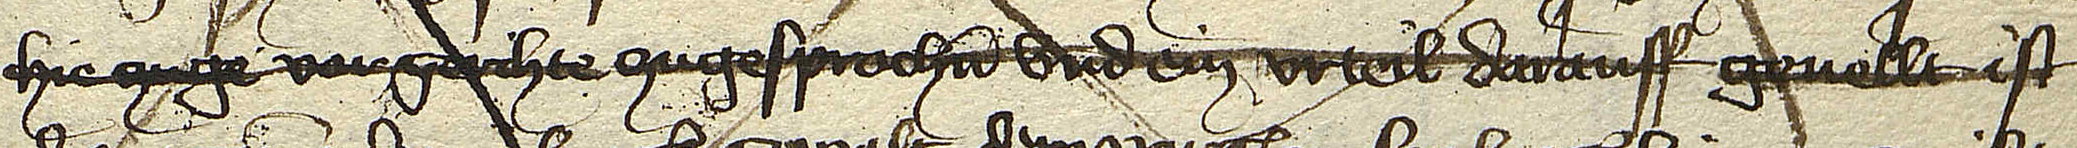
hie cʒuge vor gerihte cʒugeſprochn* vnd ein vrteil darauff geuellt iſt
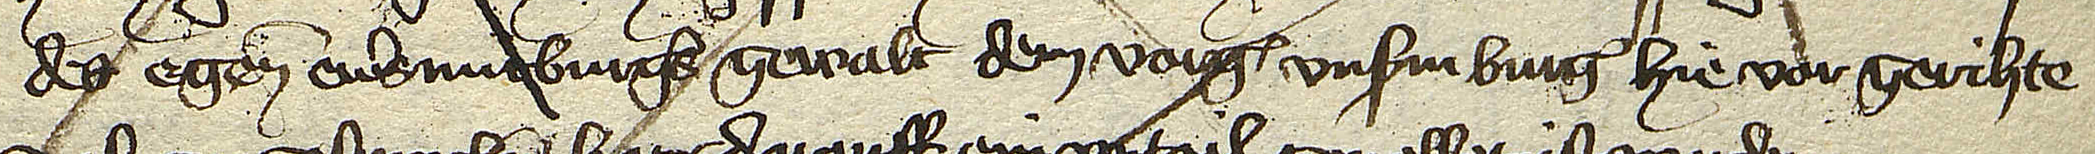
des egen* ew*s mitburgs* gewalt dem vorg* vnſ*m burg* hie vor gerihte
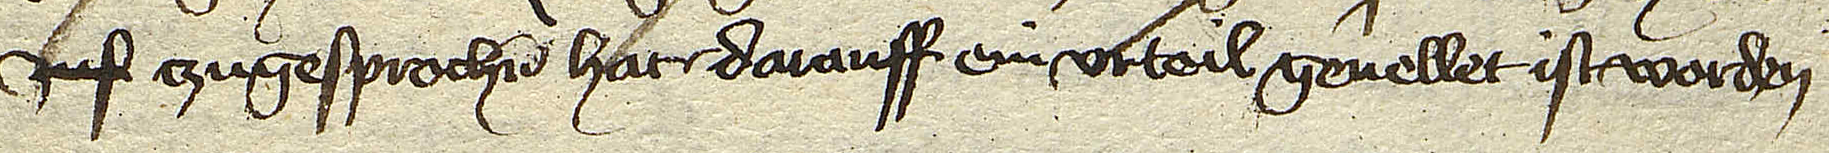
cʒuſ cʒugeſprochn* hat / darauff ein vrteil geuellet iſt worden
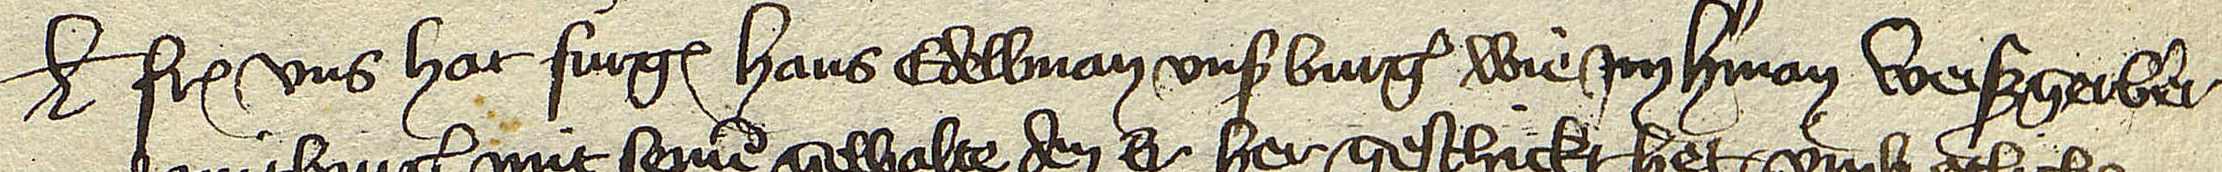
L* fr* vns hat fürg* hans Edellman vnſ* burg* wie Im h*man weiſʒgerber
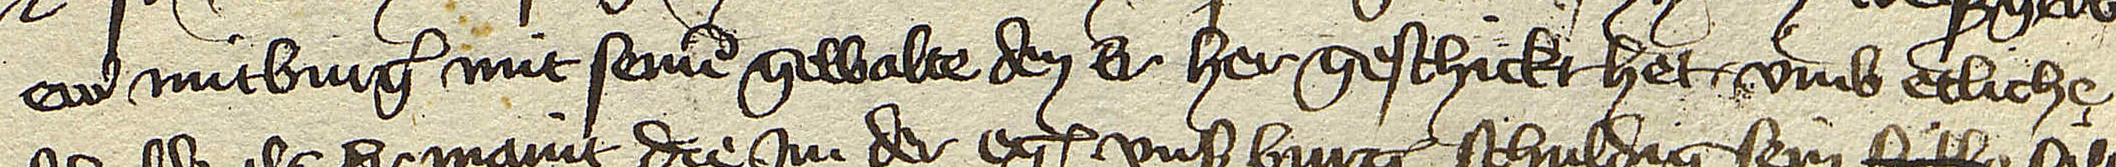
ew* mitburg* mit ſeine* gewalte den Er her geſchickt het / vmb etliche
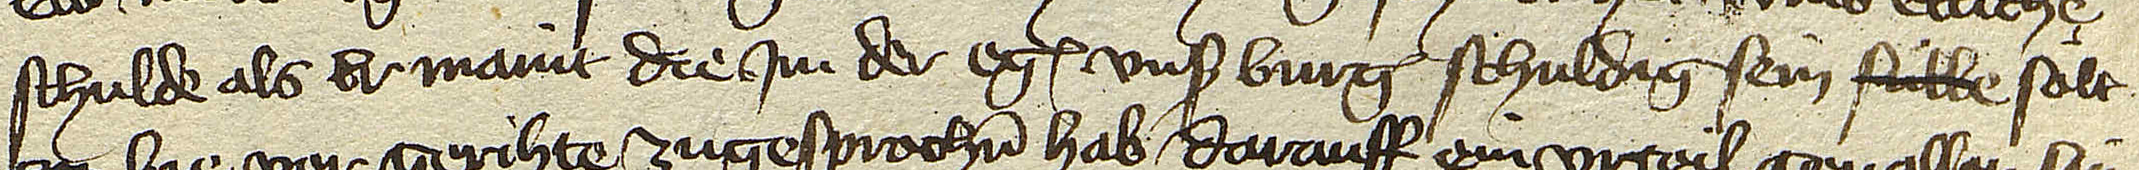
ſchulde als Er maint die Im der eg* vnſ* burg* ſchuldig ſein ſülle ſölt
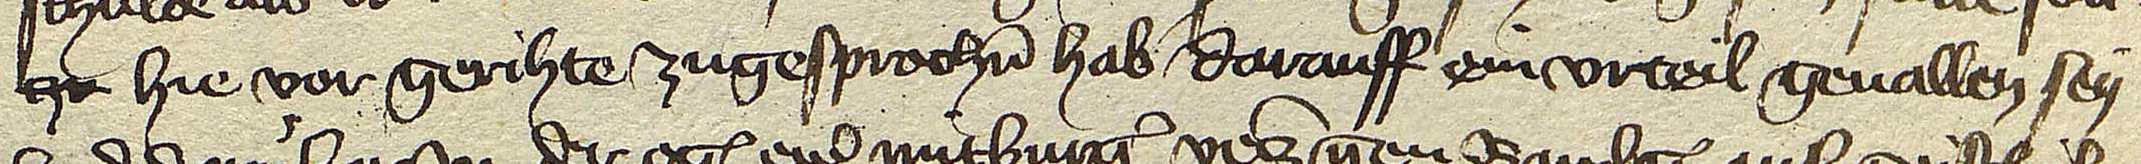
cʒu hie vor gerihte cʒugeſprochn* hab / darauff ein vrteil geuallen ſey
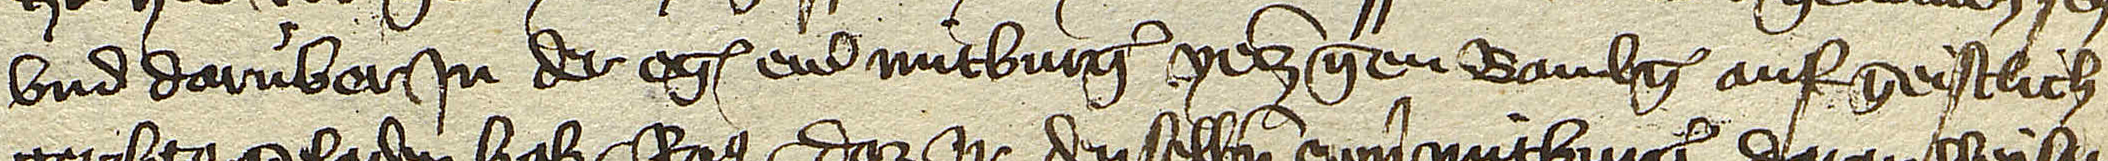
vnd darüber In der eg* ew* mitburg* yecʒ* gen Bambg* auf geiſtlich
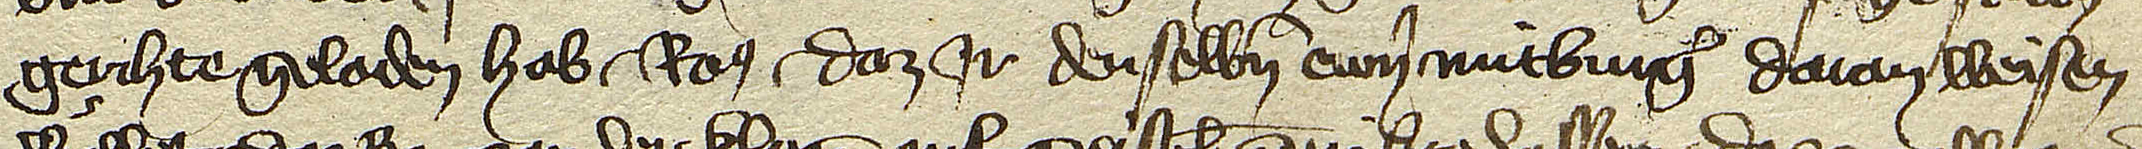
gerihte geladen hab / Ro* / daʒ Ir denſelbn* ewn* mitburg* daran weiſen
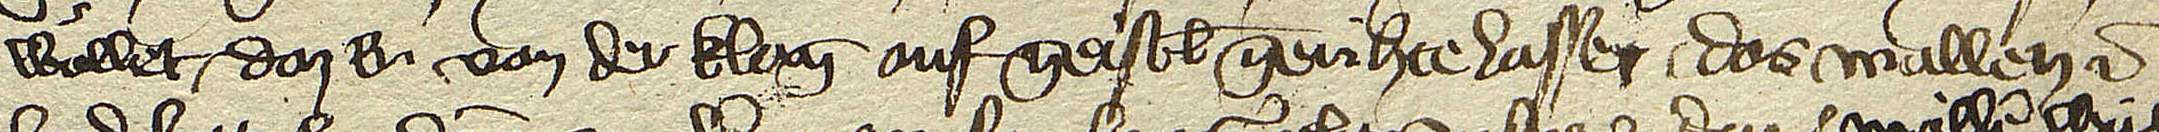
wöllet / daʒ Er von der klag auf geiſtl* gerihte laſſe / das wollen ec*
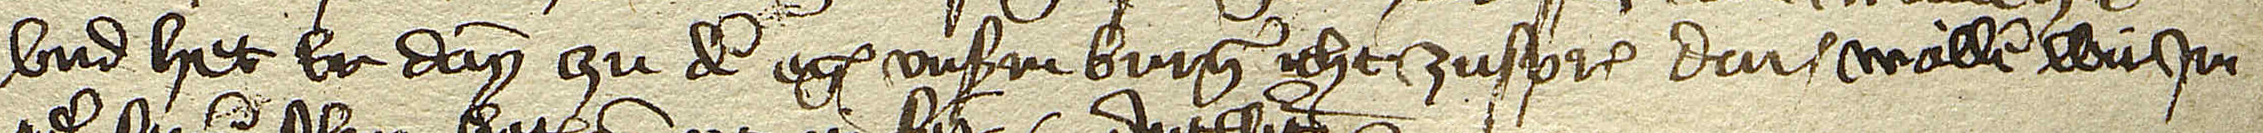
vnd het Er dan* cʒu d* eg* vnſ*m burg* icht cʒuſpr* dar* wölle* wir Im
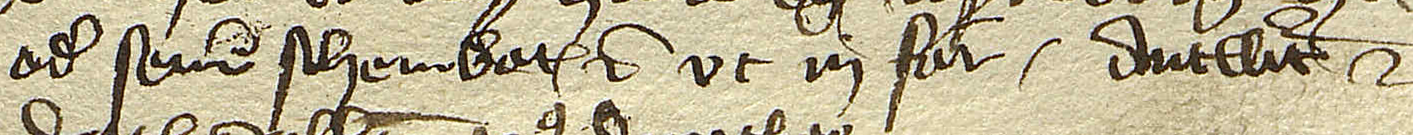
od* ſeine* ſcheinbot* ec* vt in for* / Antw*t ec*
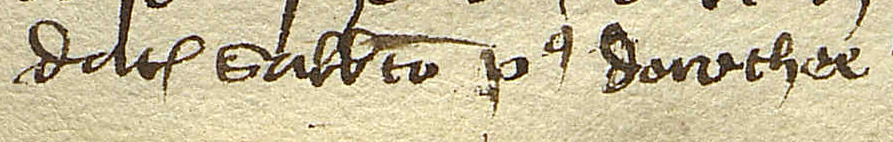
dat* Sabbto* p* dorothee
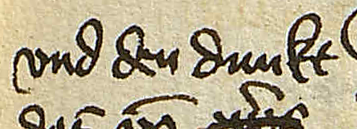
vnd den dunkt
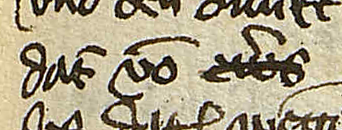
das vo* ews*
